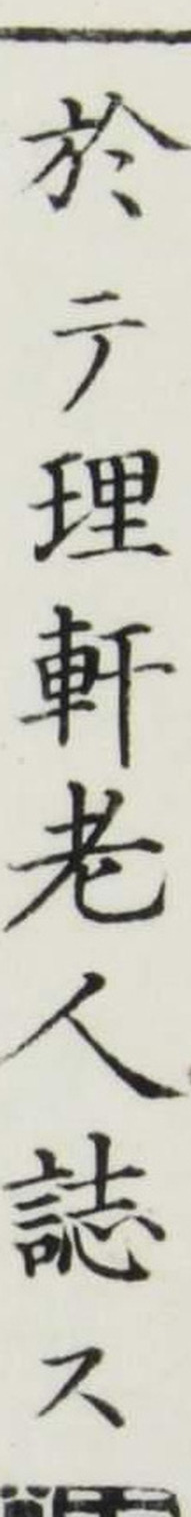於テ理軒老人誌ス
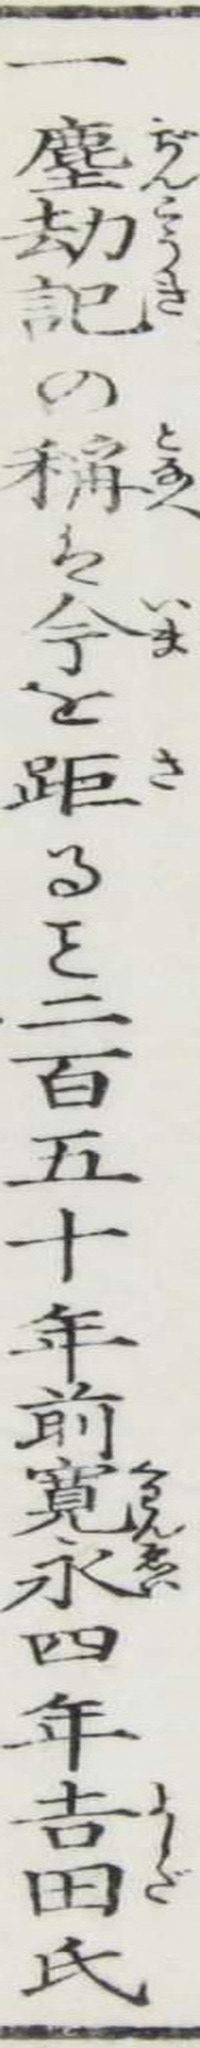一塵劫記の称は今を距ること二百五十年前寛永四年吉田氏
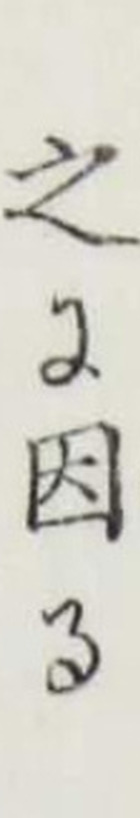之に因る
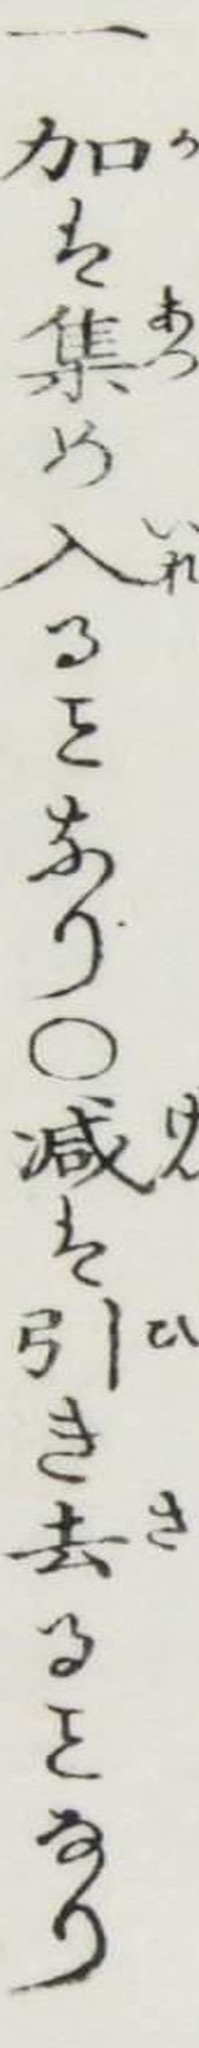一加は集め入ることなり○減は引き去ることなり
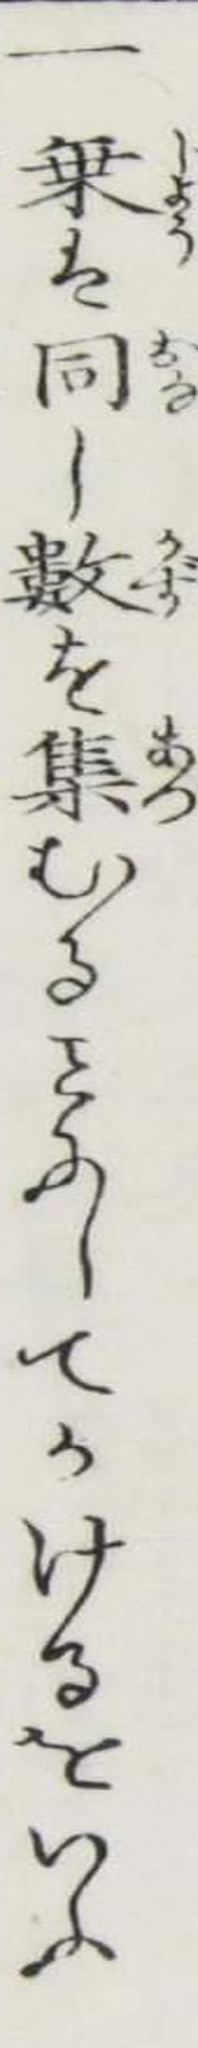一乗は同し数を集むることにしてかけるをいふ
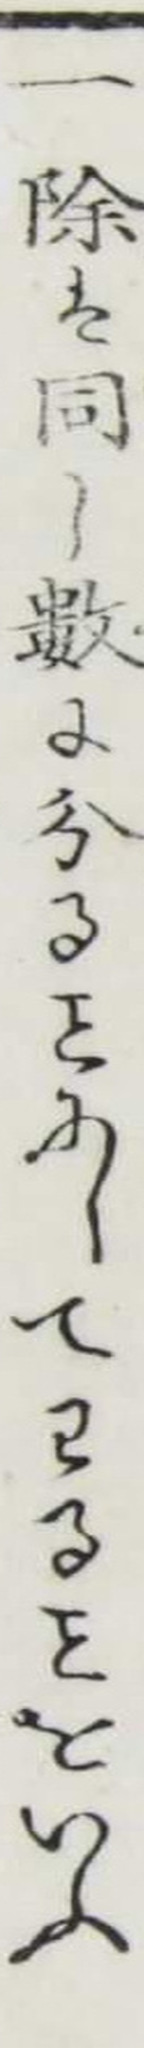一除は同し数に分ることにしてわることをいふ
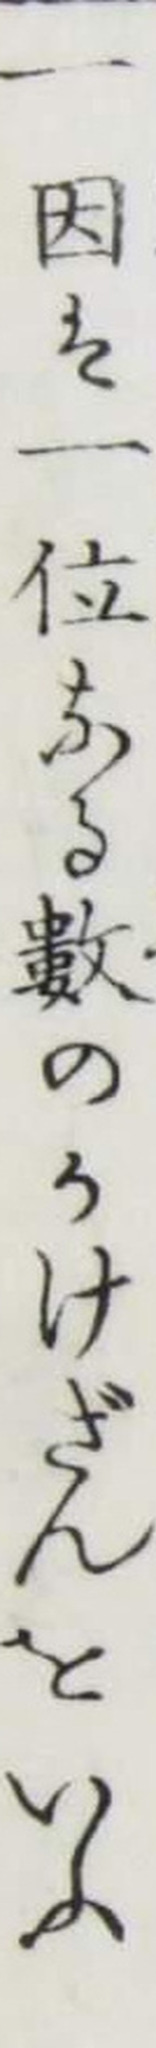一因は一位なる数のかけざんをいふ
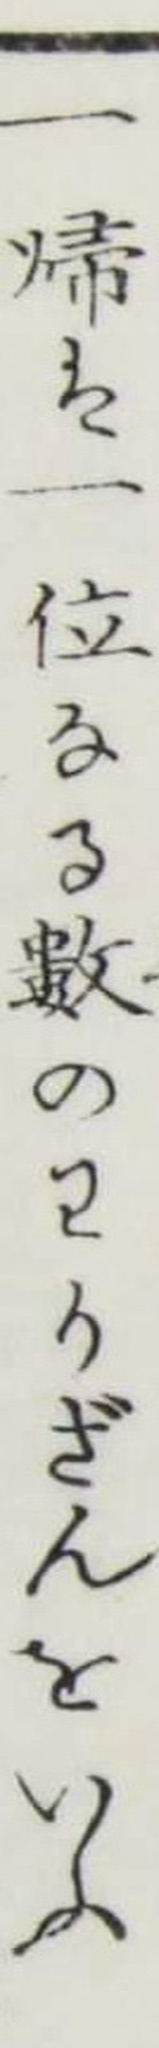一帰は一位なる数のわりざんをいふ
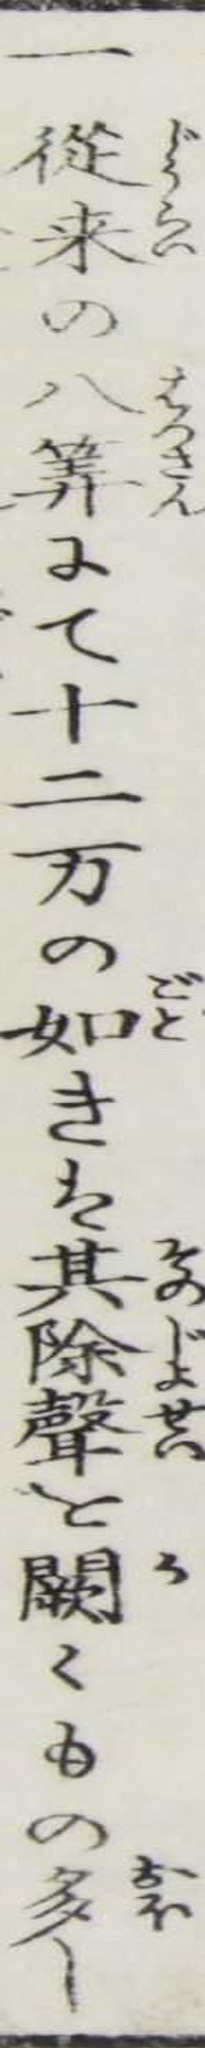一従来の八算にて十二万の如きは其除声を闕くもの多し
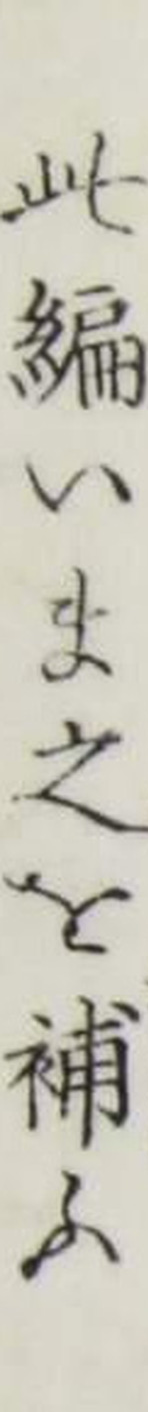此編いま之を補ふ

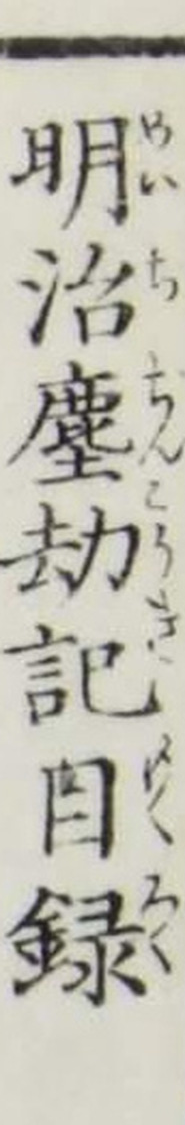明治塵劫記目録
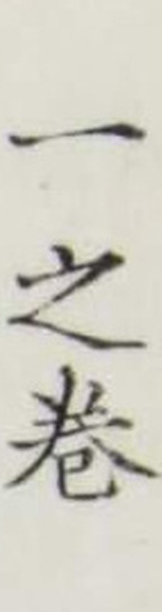一之巻
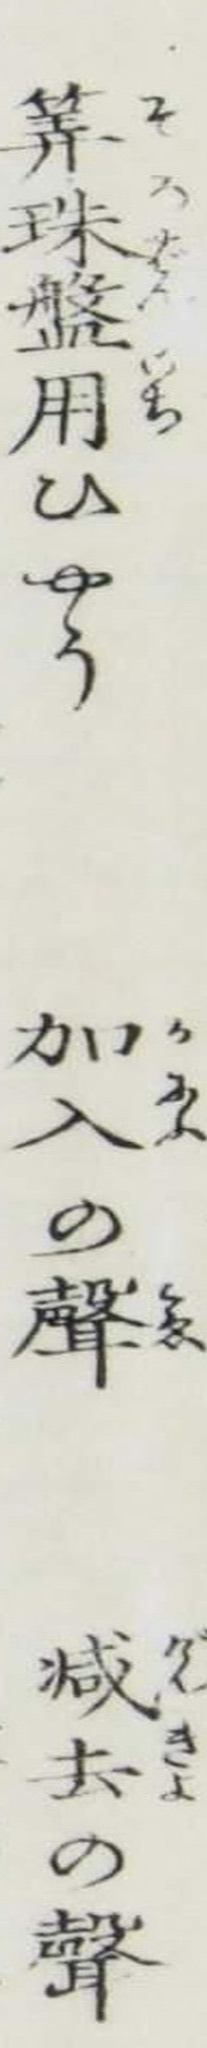算珠盤用ひやう加入の声減去の声
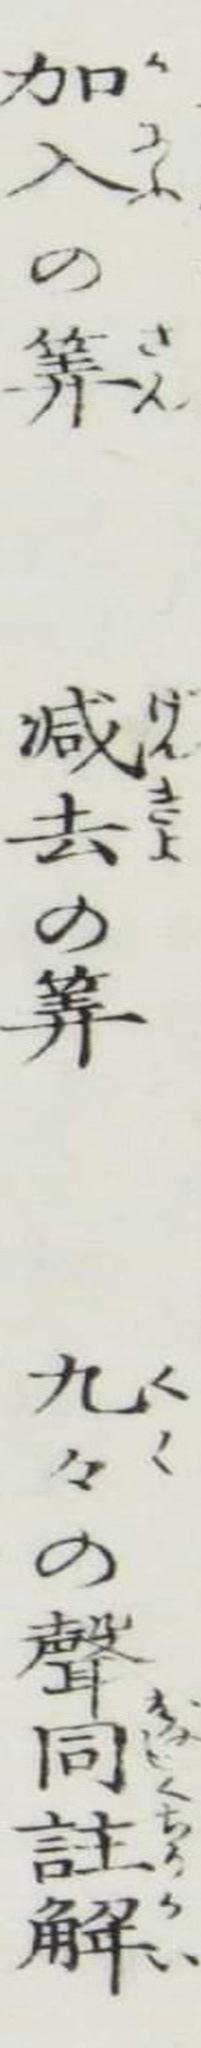加入の算減去の算九々の声同註解
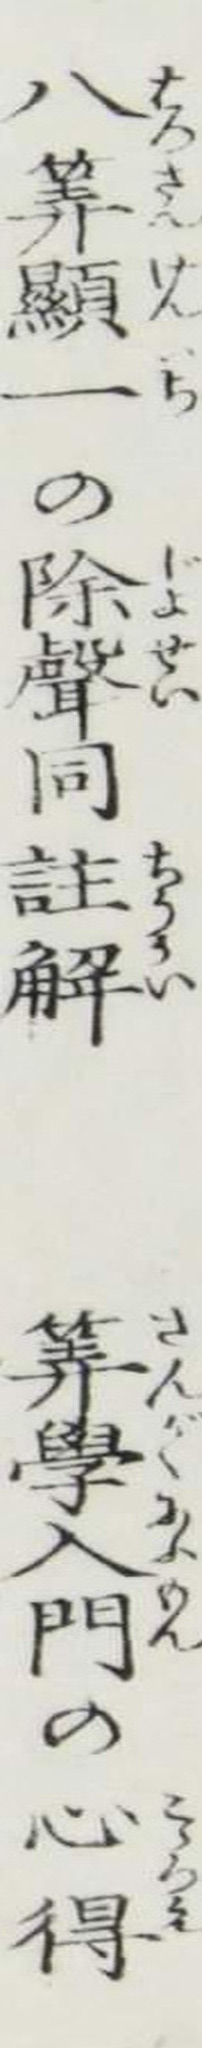八算顕一の除声同註解算学入門の心得
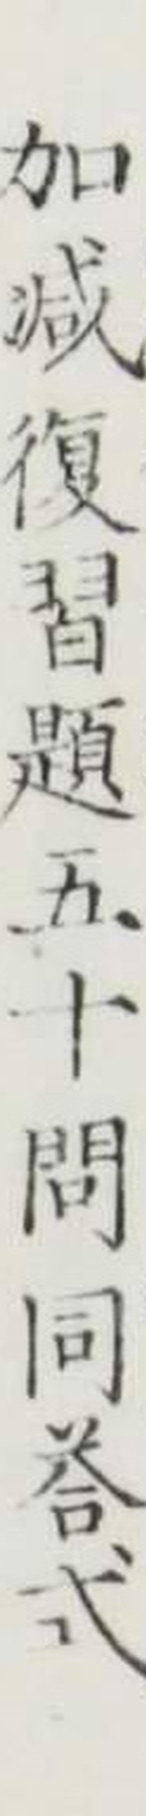加減復習題五十問同答式
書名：明治小學塵劫記 卷1
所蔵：東京学芸大学教育コンテンツアーカイブ
